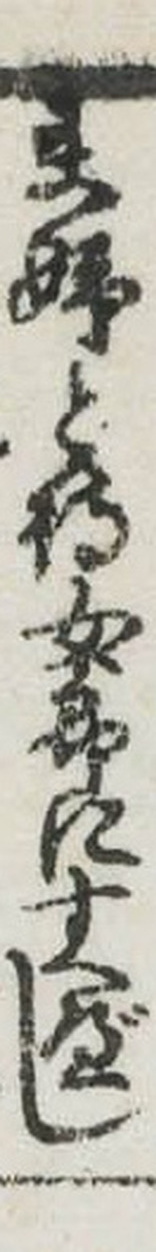夫婦と待女郎にすへべし
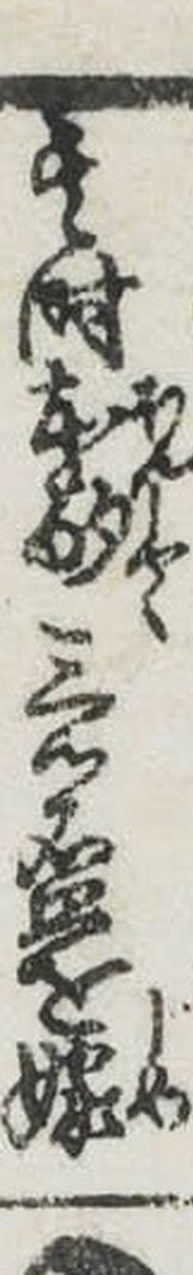其時本酌三ツ盃を嫁
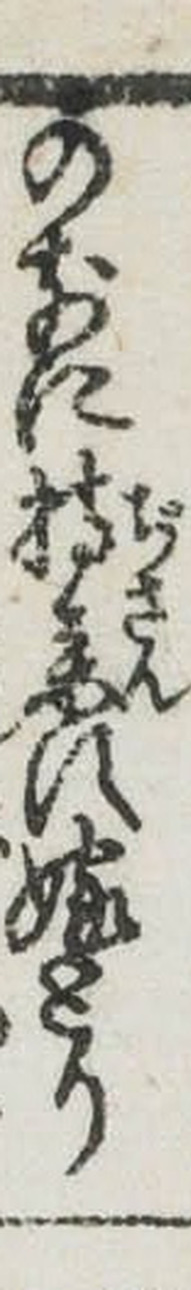の前に持参す嫁とり
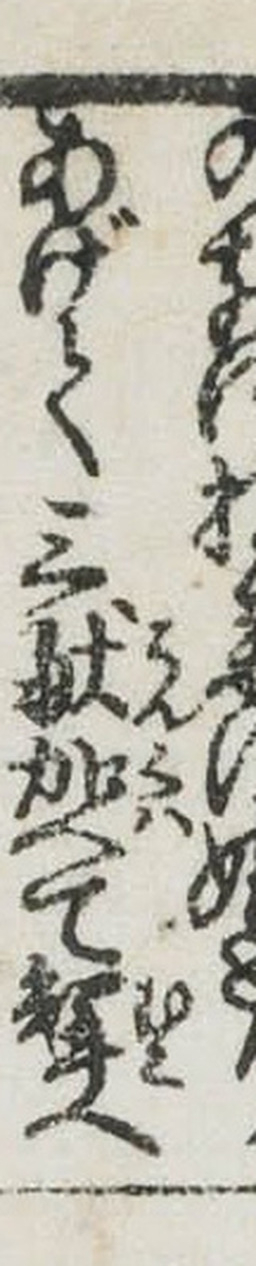あげて三献加へて聟へ
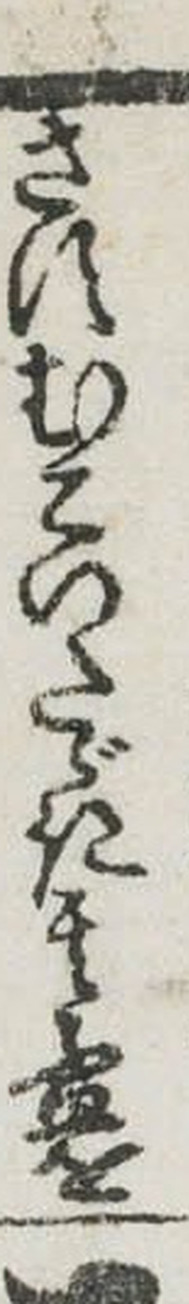さすむこいたゞき其盃を
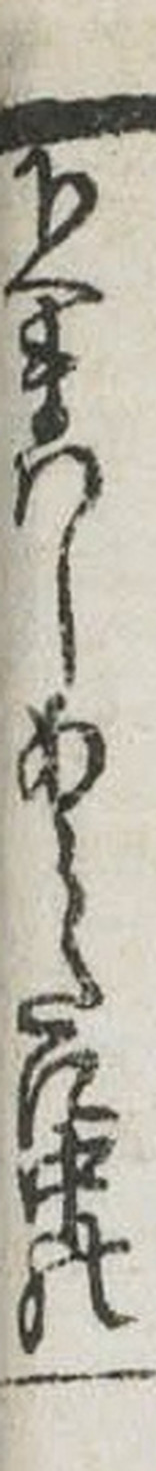下へまはしあらたに中の
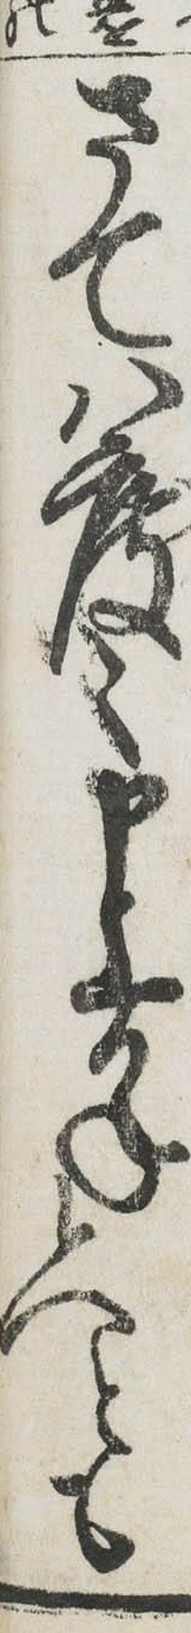さては度々申上かね候へとも
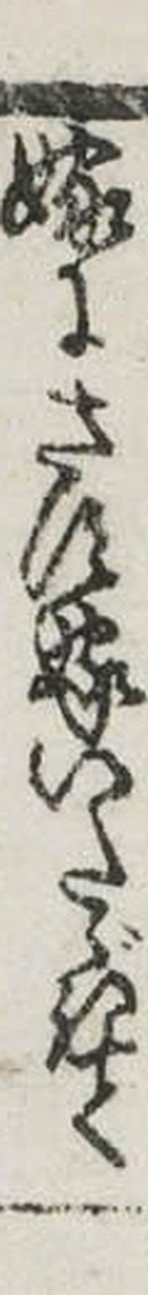嫁にさす嫁いたゞきて
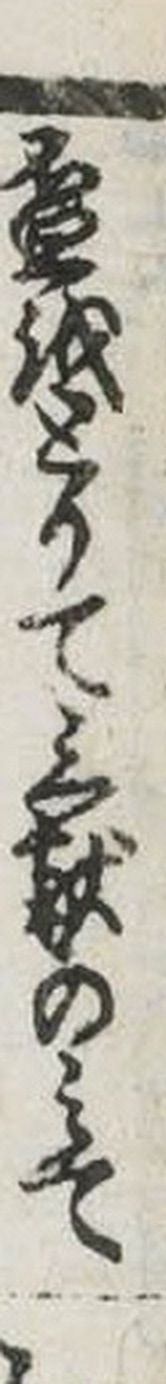盃をとりて三献のみて
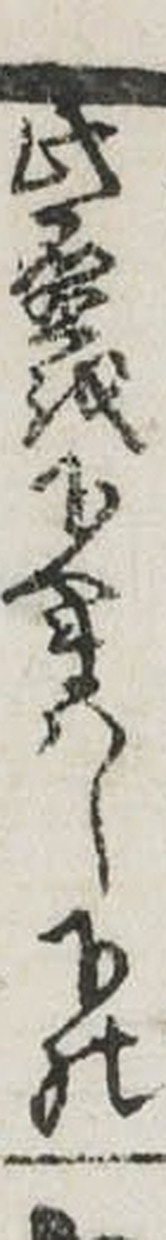此盃を下へまはし下の
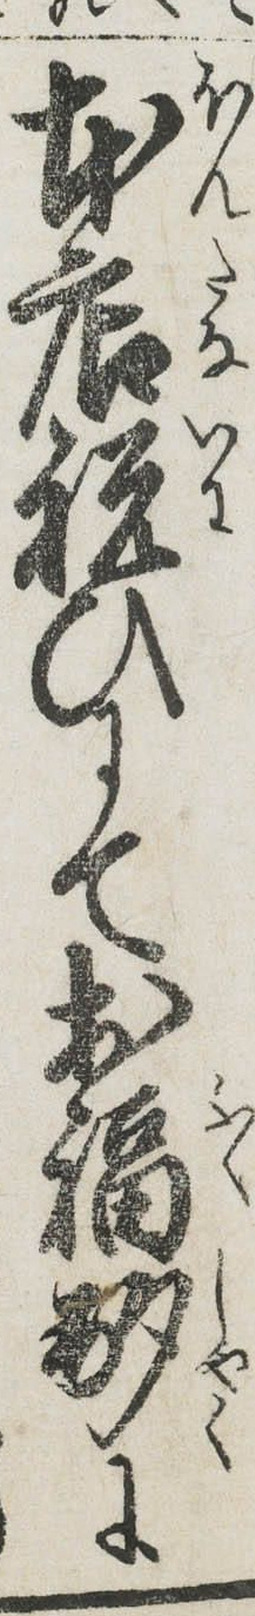本店祝ひにてお福酌に
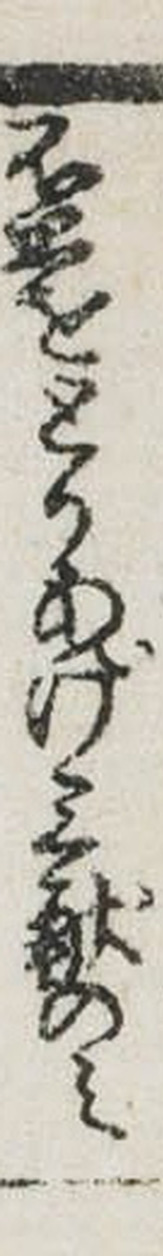盃をとりあげ三献のみ
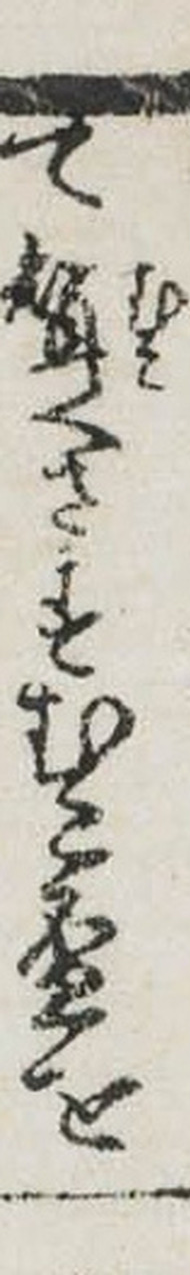て婿へさすむこ盃を
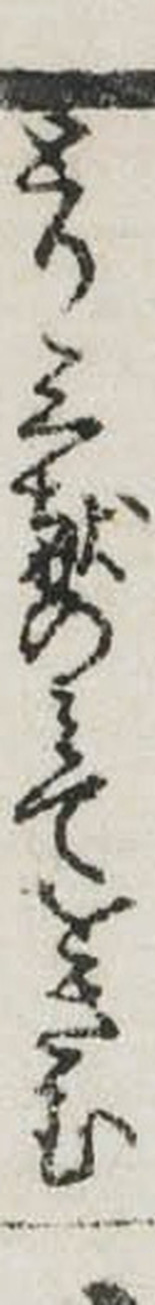とり三献のみておさむ
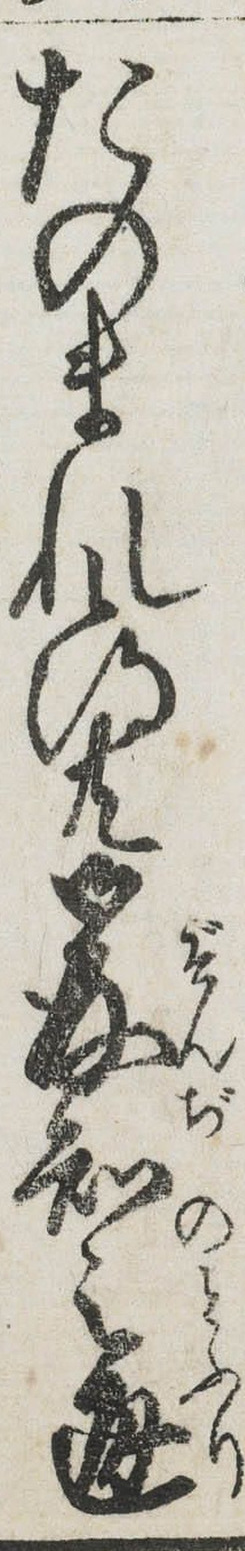たのまれ候得共御存知之通
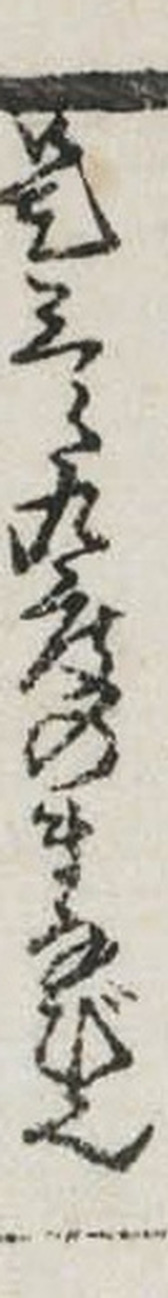是三々九度のまなび也
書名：頭書萬用婦人手紙之文言
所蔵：東京学芸大学教育コンテンツアーカイブ
